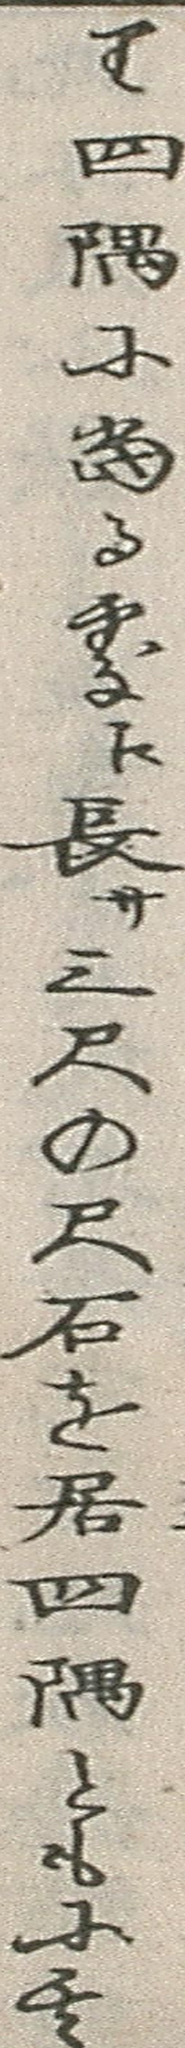り四隅に当る処江長三尺の尺石を居四隅ともに其
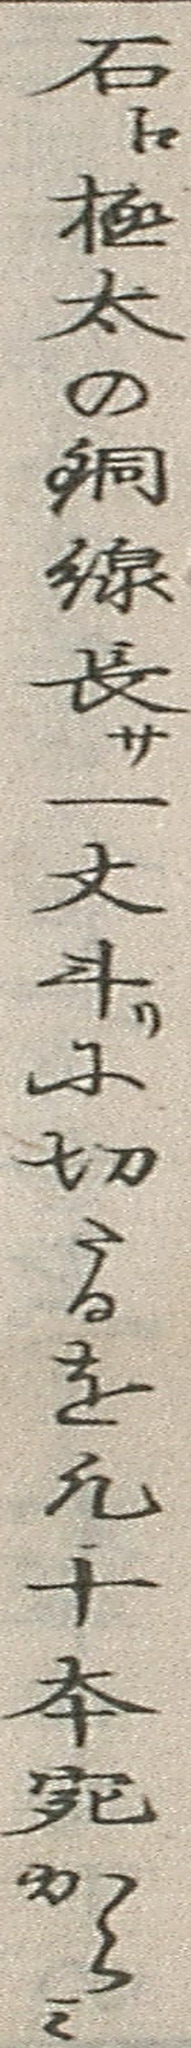石江極太の銅線長一丈斗切たるを凡十本宛からみ
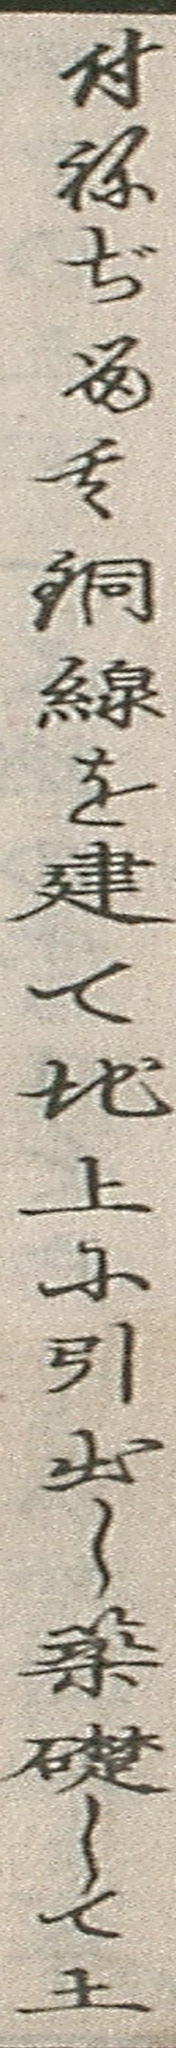付ねぢ留其銅線を建て地上に引出し築礎して土
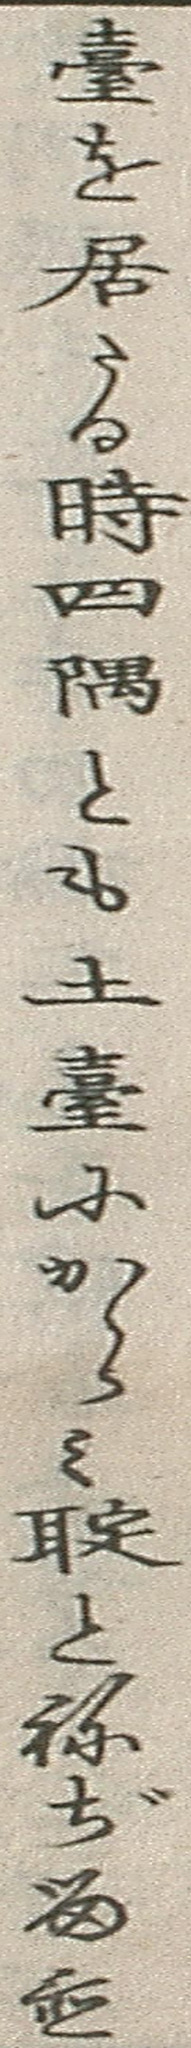臺を居たる時四隅とも土臺にからみ聢とねぢ留置
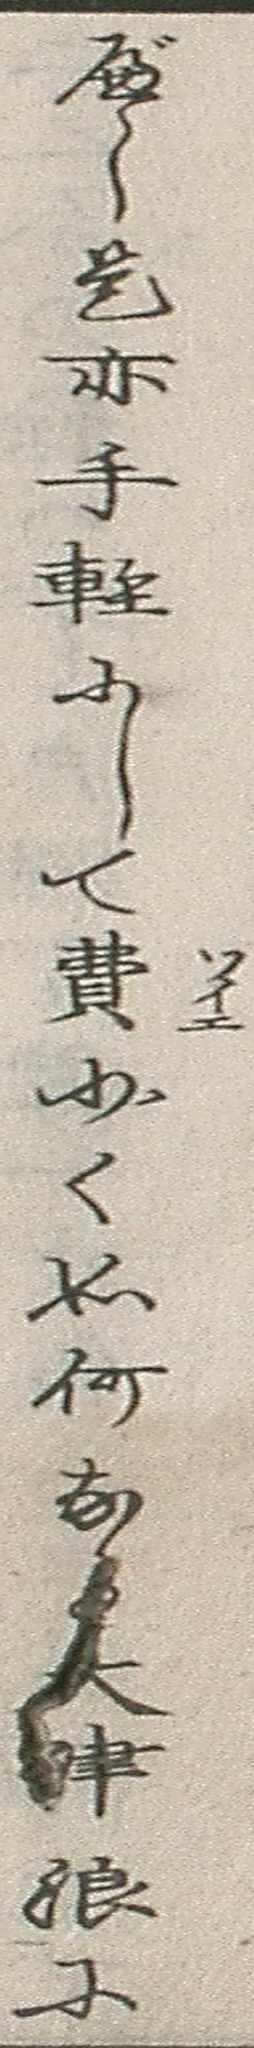べし是亦手軽にして費なく如何なる大津浪に
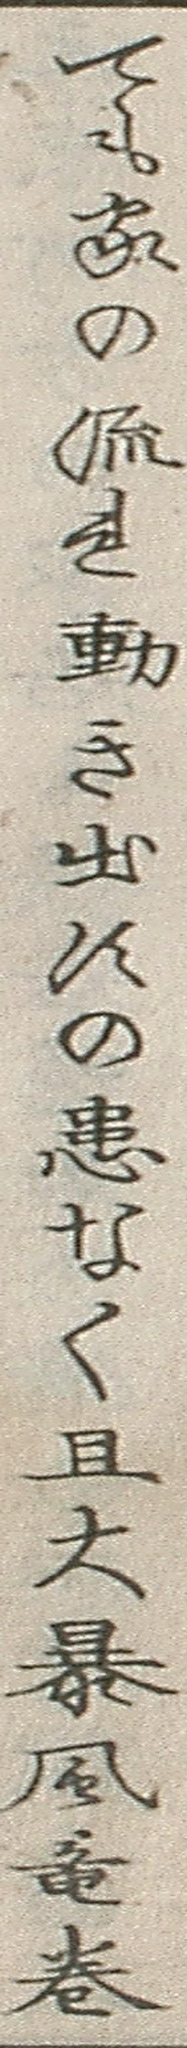ても家の流れ動き出すの患なく且大暴風竜巻
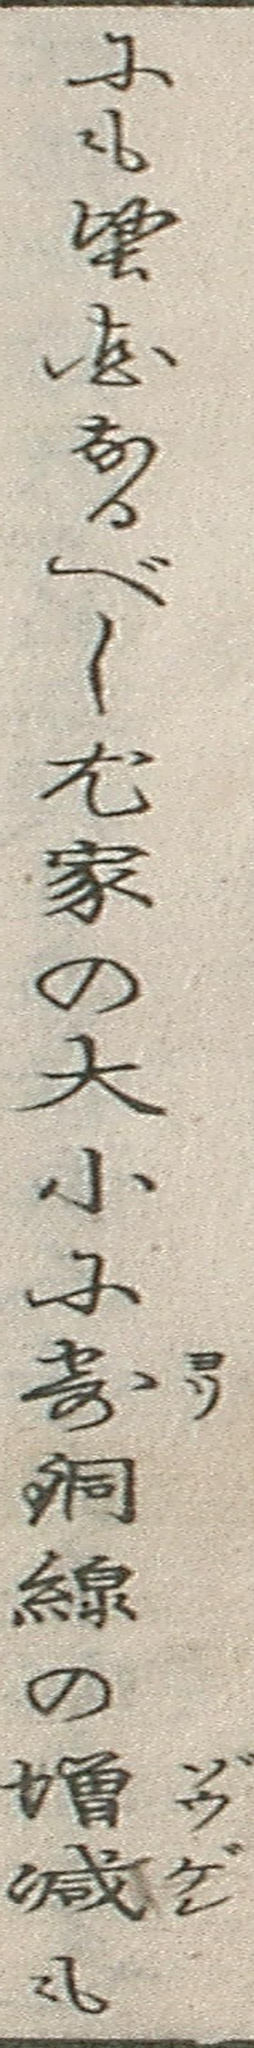にも堅固なるべし尤家の大小に寄銅線の増減も
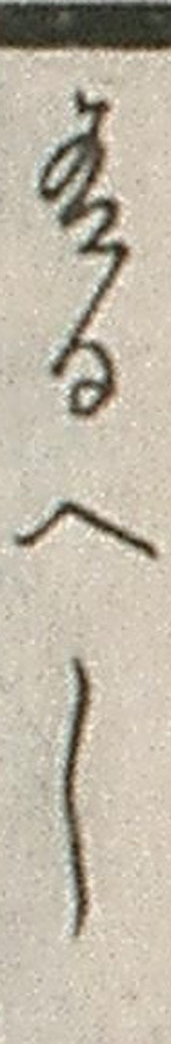有るへし
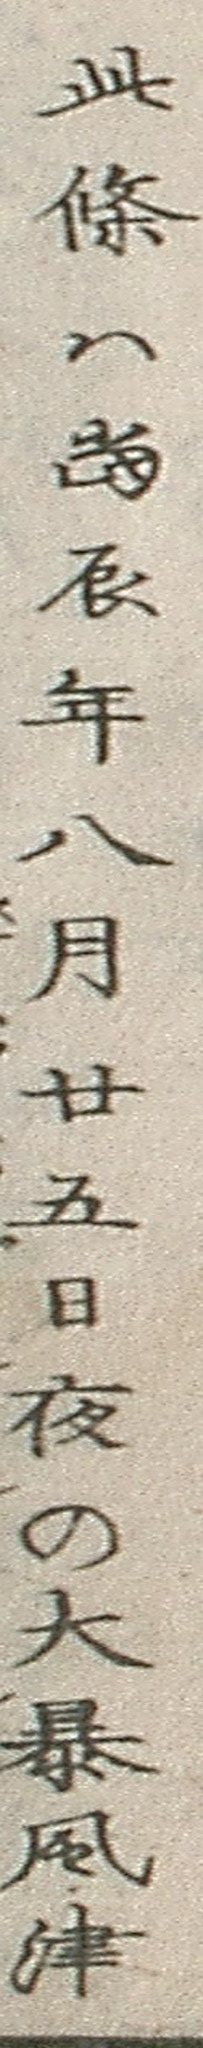此條は当辰年八月廿五日夜の大暴風津
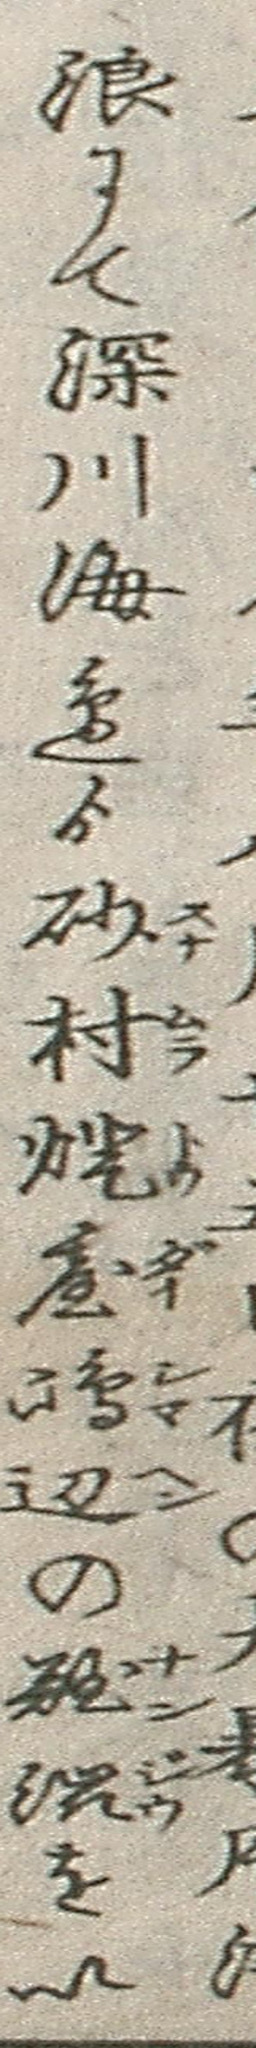浪にて深川海辺ゟ砂村燈臺嶋辺の難渋を以

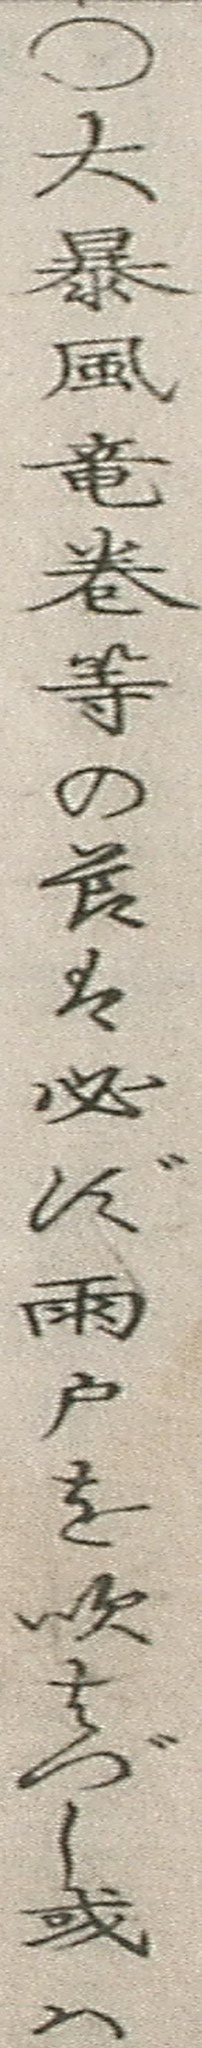〇大暴風竜巻等の節は必ず雨戸を吹はずし或は
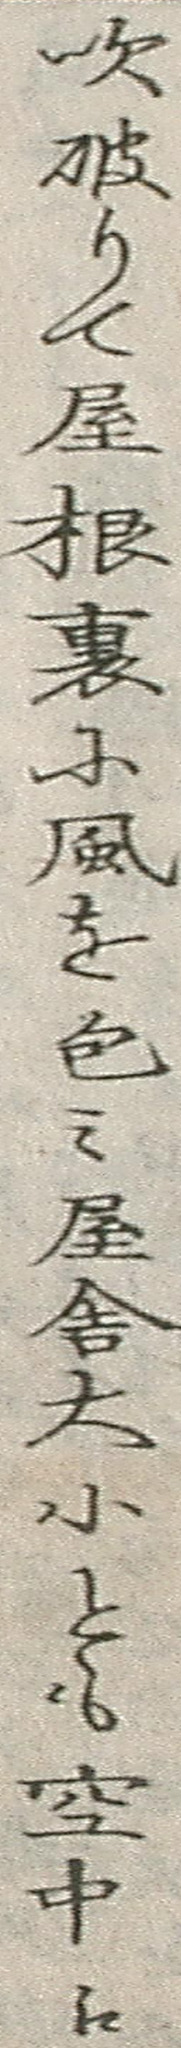吹破りて屋根裏に風を包み屋舎大小とも空中江
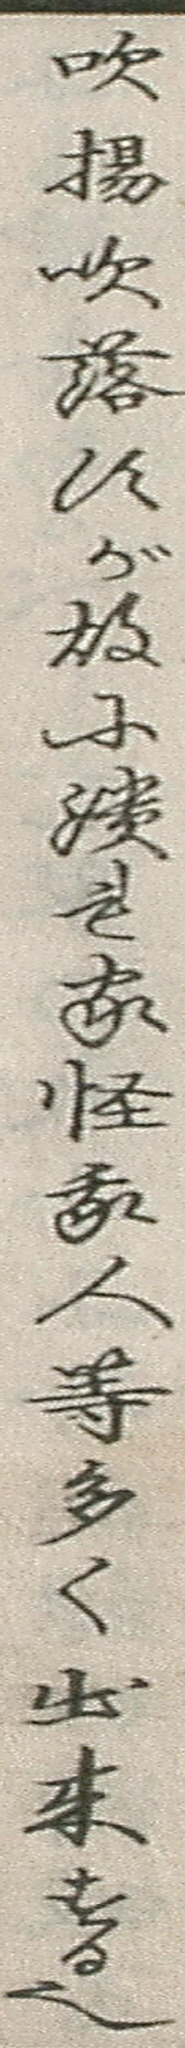吹揚吹落すが故に潰れ家怪我人等多く出来する也
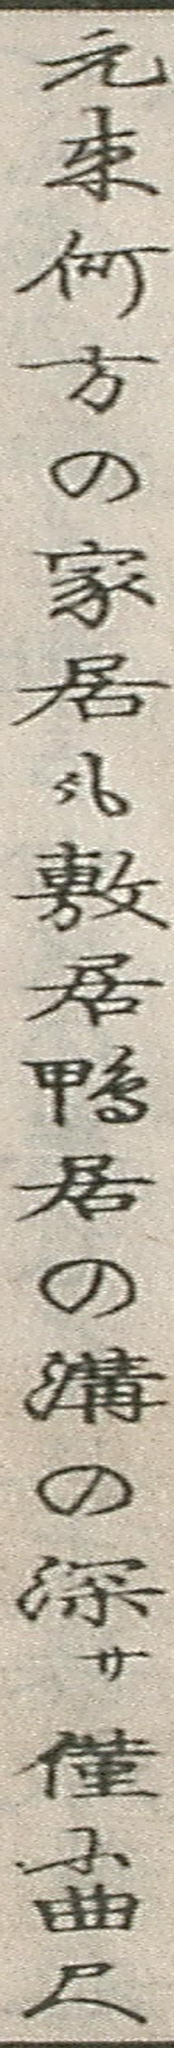元来何方の家居も敷居鴨居の溝の深僅に曲尺
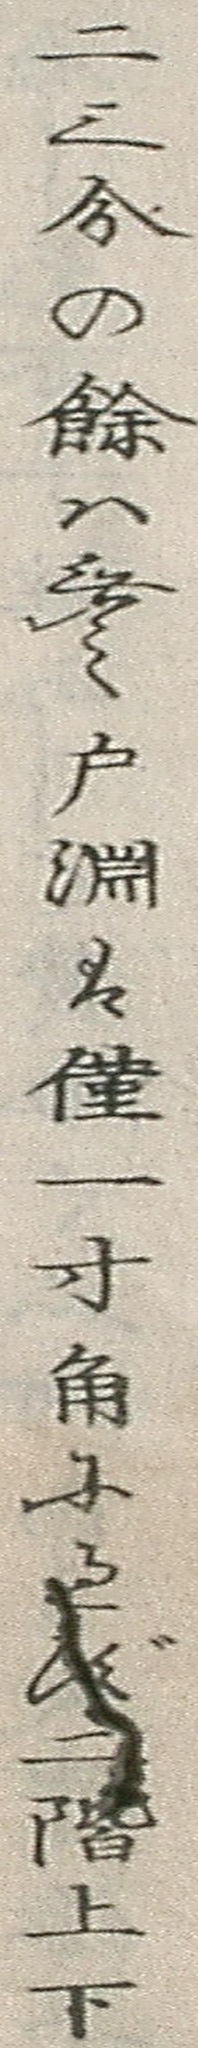ニ三分の余は無之戸淵は僅一寸角に過ず二階上下
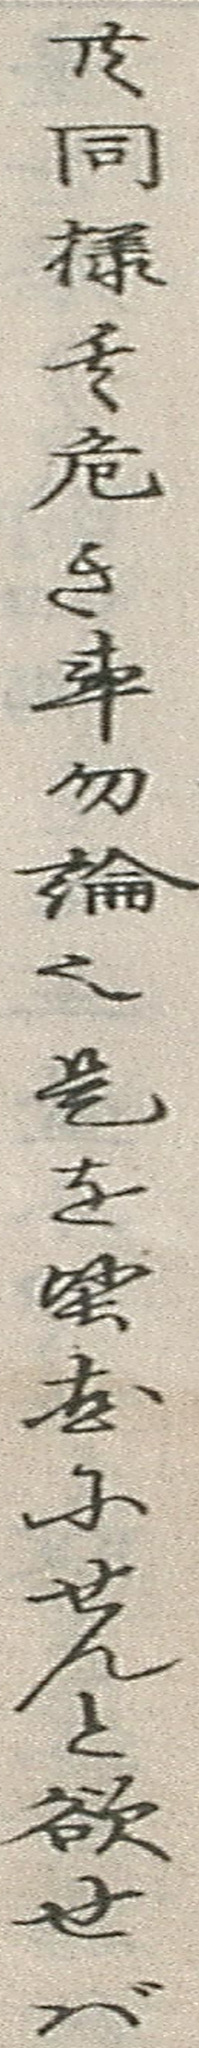共同様其危き事勿論也是を堅固にせんと欲せば
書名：附録　地震劇風災害豫防法圖説（内題）
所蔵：東京大学地震研究所図書室 Earthquake Research Institute Library, The University of Tokyo, JAPAN
